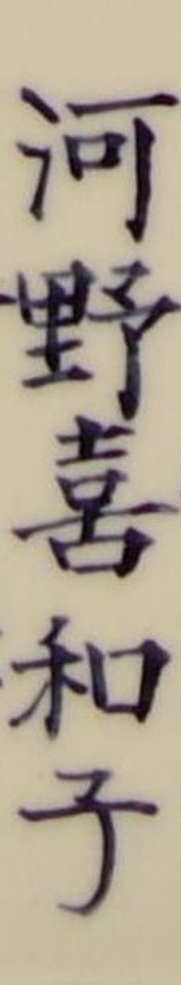河野喜和子
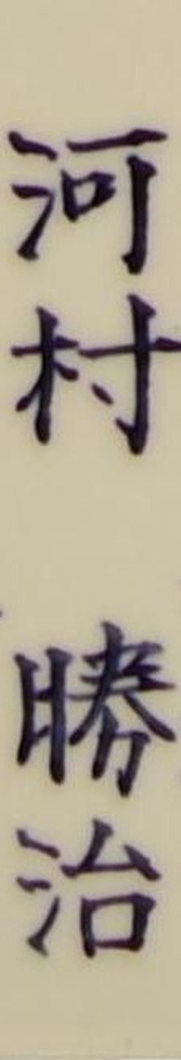河村勝治
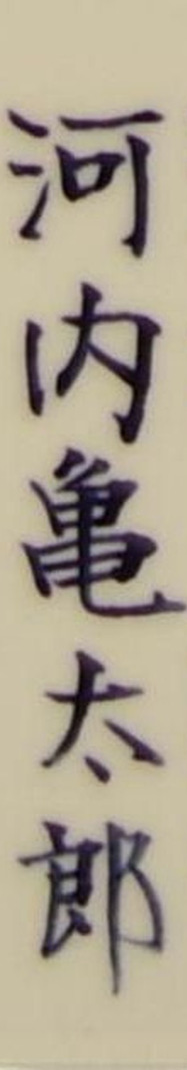河内亀太郎
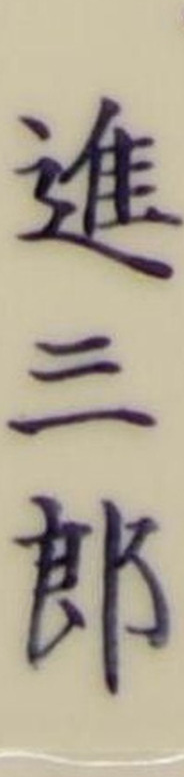進三郎
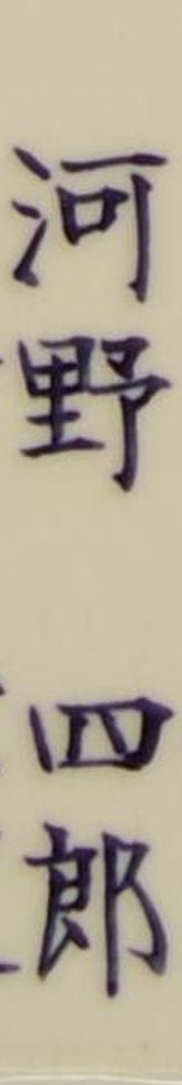河野四郎
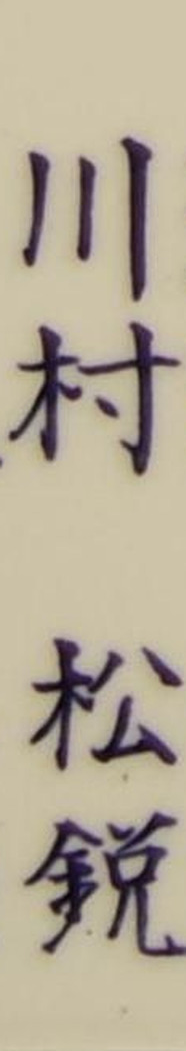川村松鋭
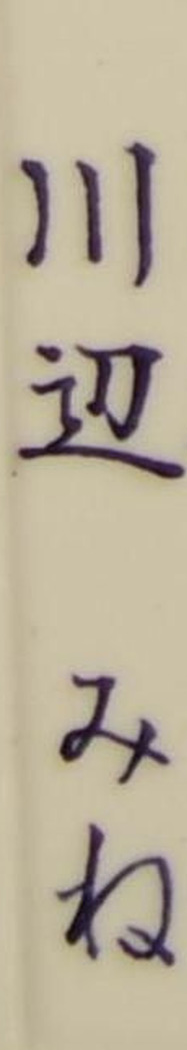川辺みね

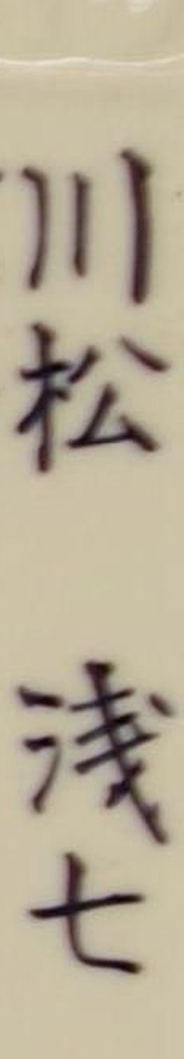川松浅七
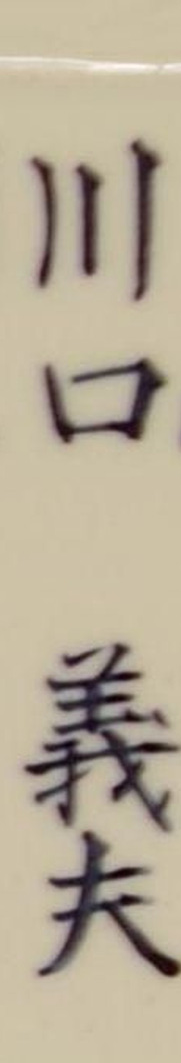川口義夫
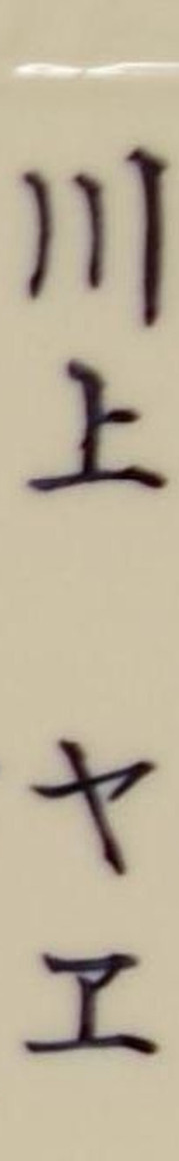川上ヤヱ
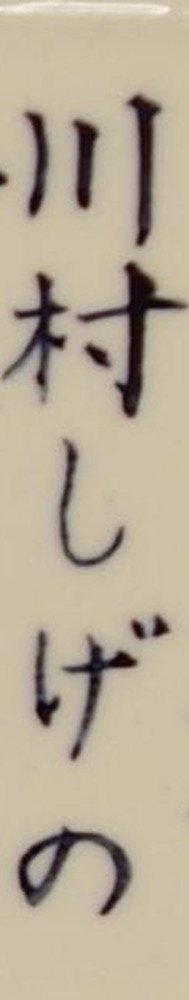川村しげの
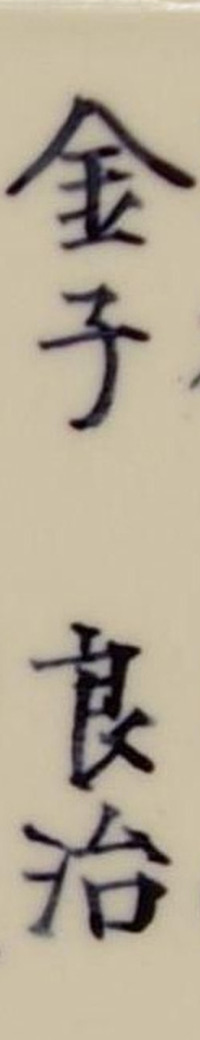金子良治
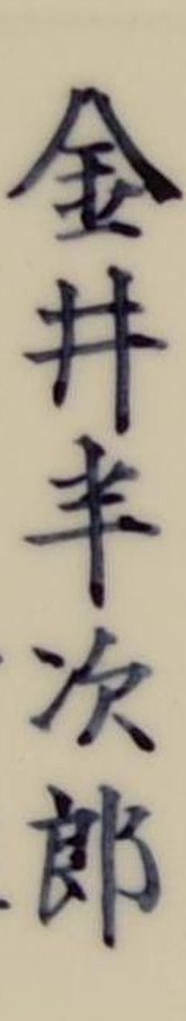金井半次郎
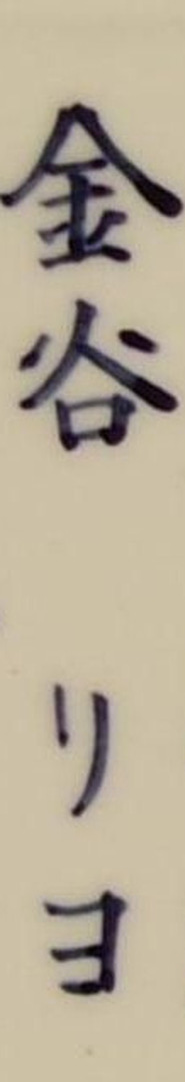金谷リヨ
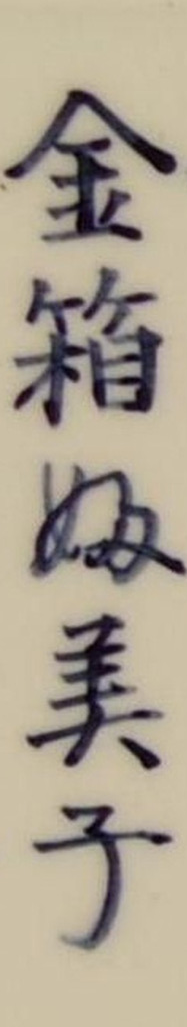金箱ふみ子
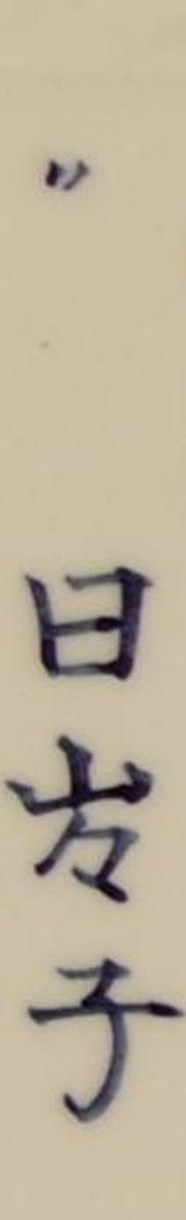日出子
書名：E~L
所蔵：高野山金剛峯寺
